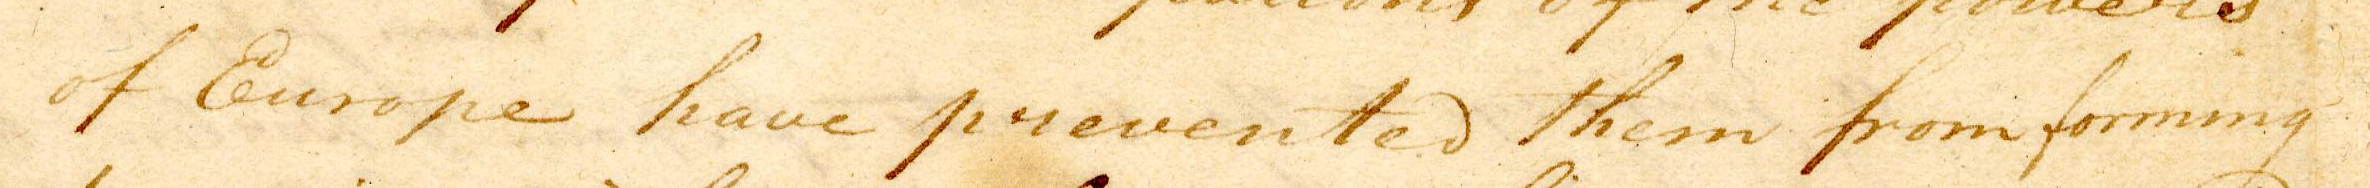of Europe have prevented them from forming
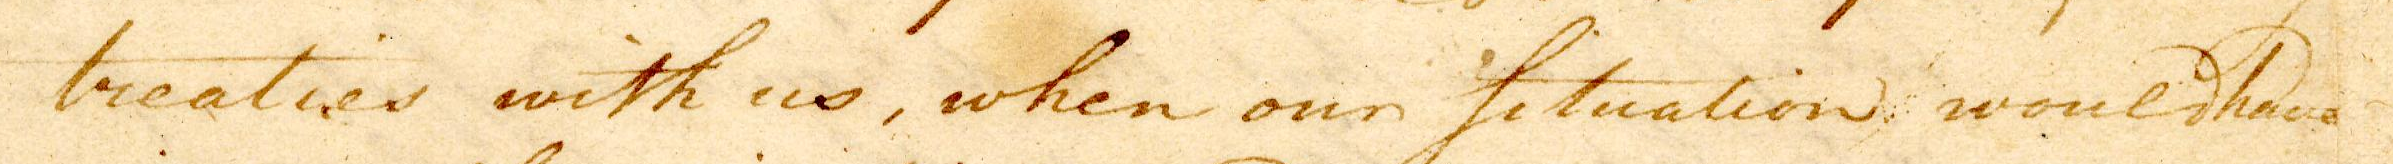treaties with us, when our situation would have
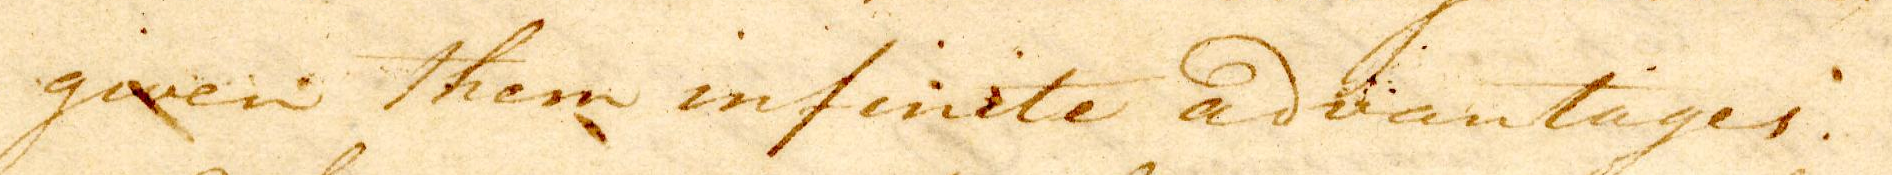given them infinite advantages.
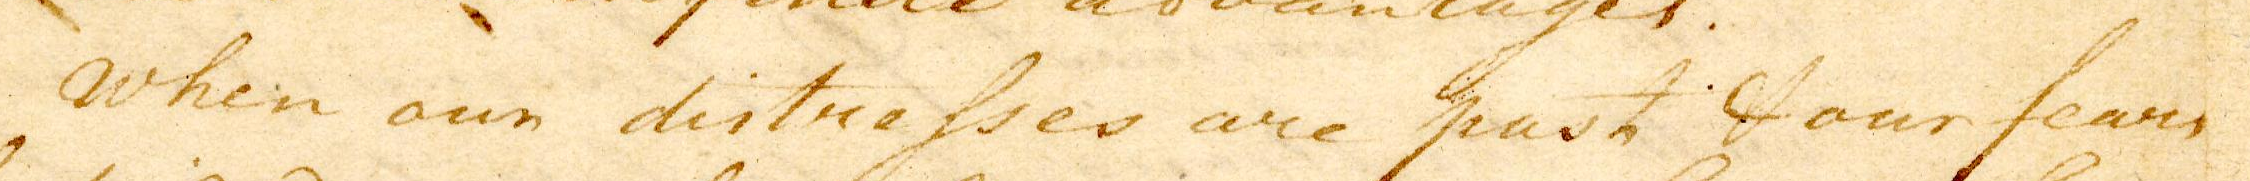when our distresses are past & our fears
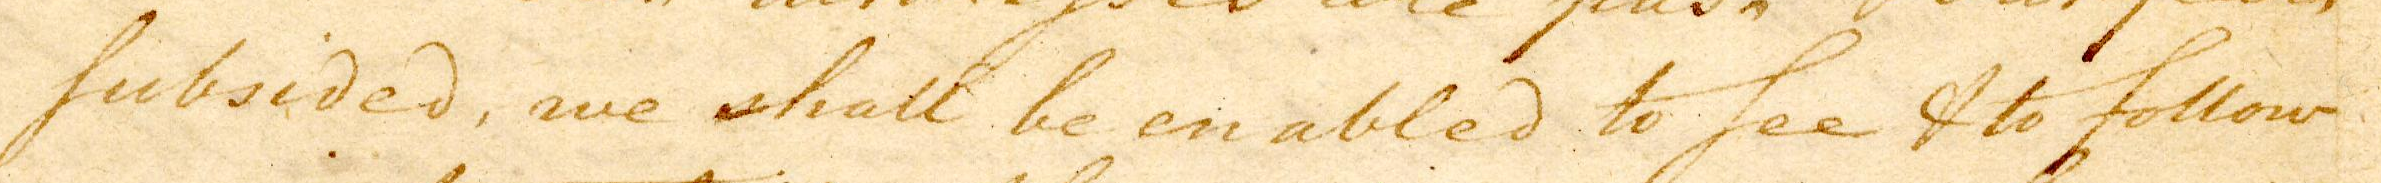subsided, we shall be enabled to see & to follow
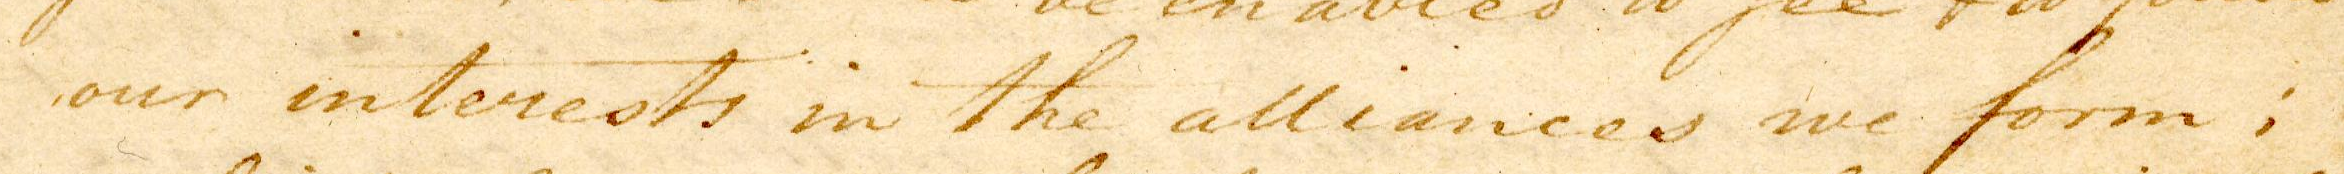our interests in the alliances we form;
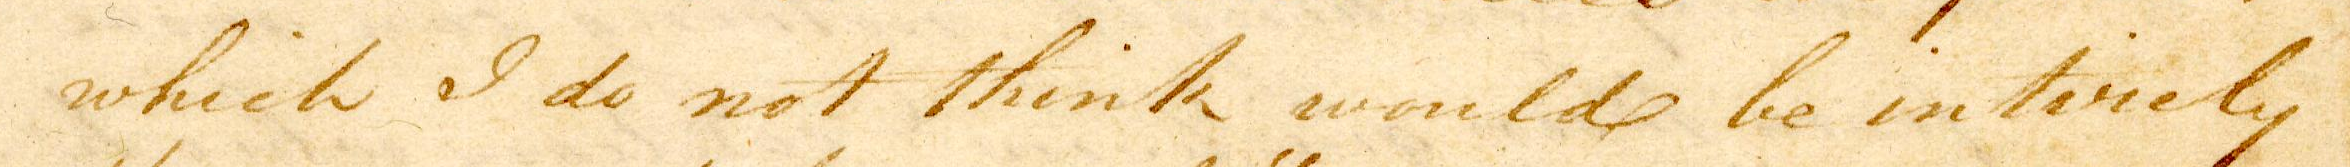which I do not think would be intirely
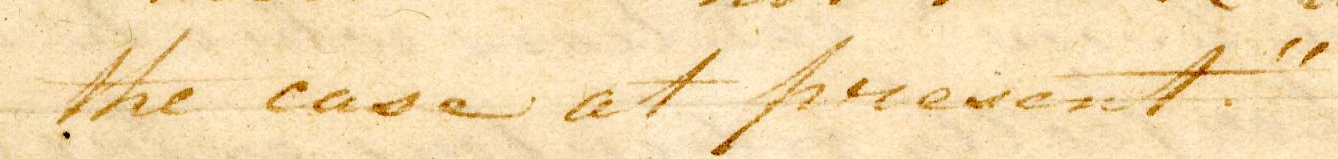the case at present.
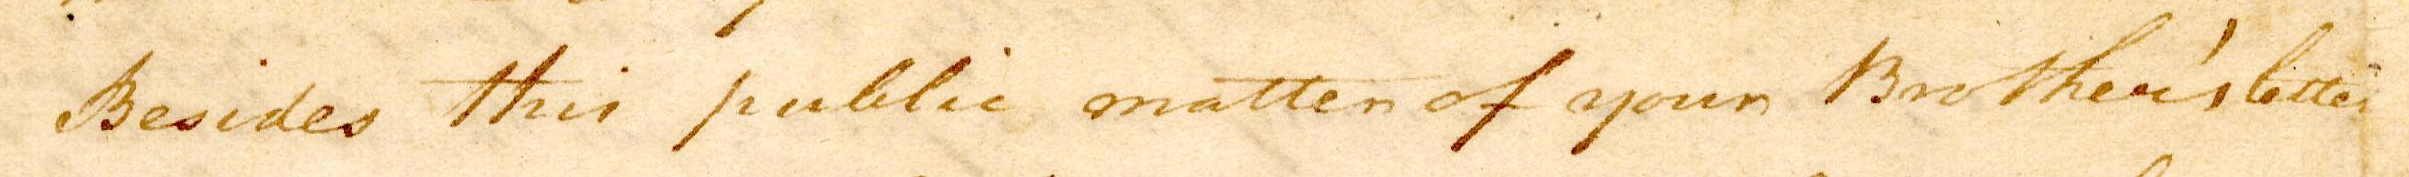Besides this public matter of your Brother's letters
